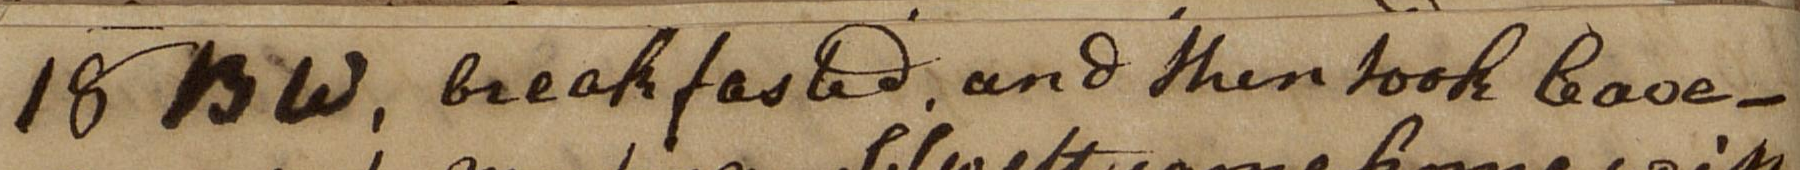18 BW, breakfasted and then took leave-
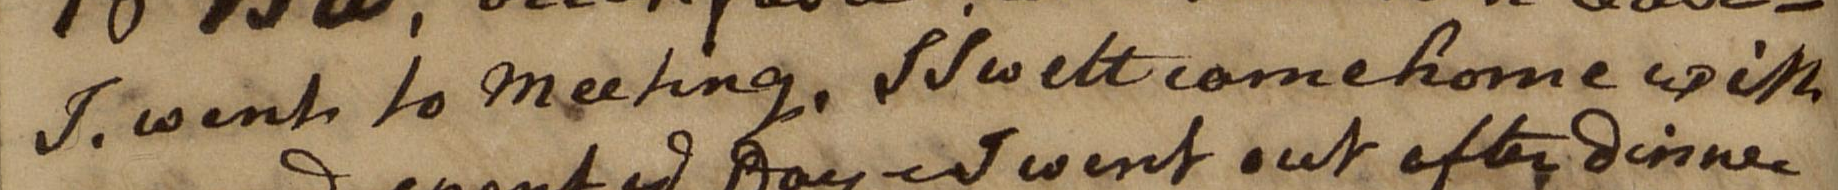I. went to meeting. S Swett came home with
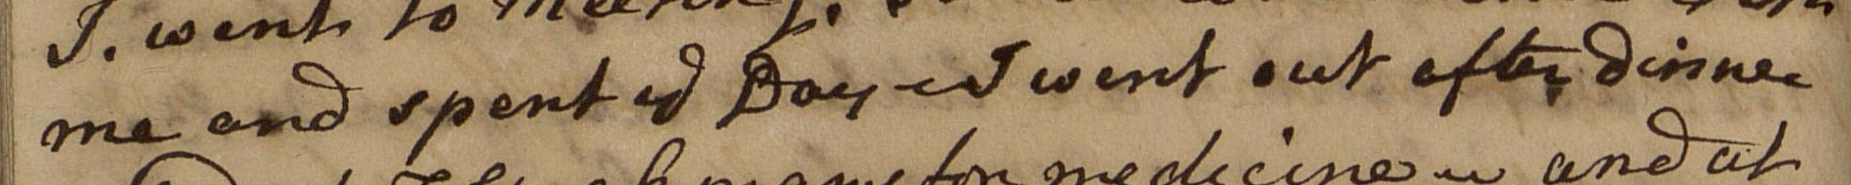me and spent y^e Day - I went out after dinner
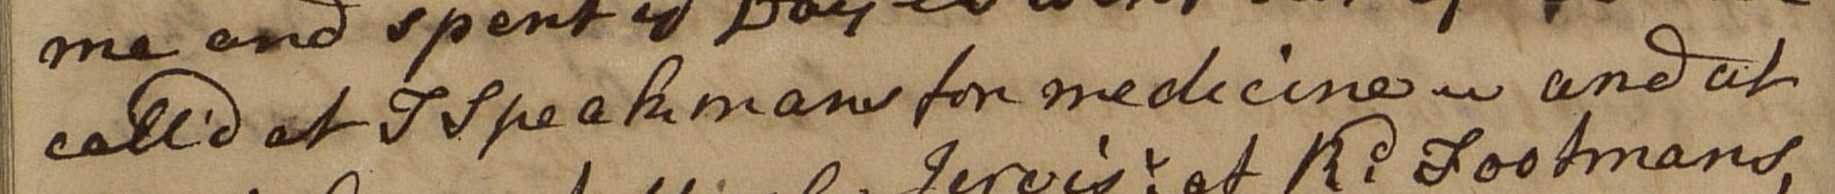call'd at T Speakmans for medicine- and at
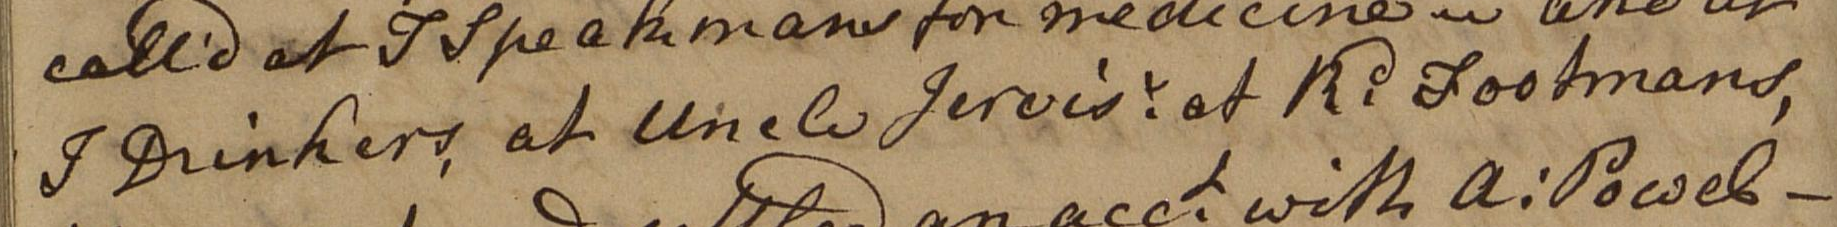J Drinkers, at Uncle Jervis.^s at R.^d Footmans,
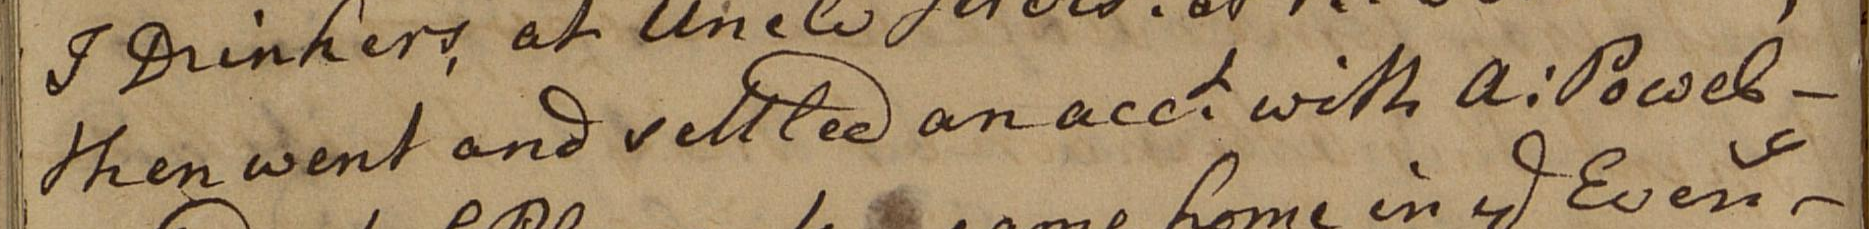then went and settled an acc^t. with A: Powel-
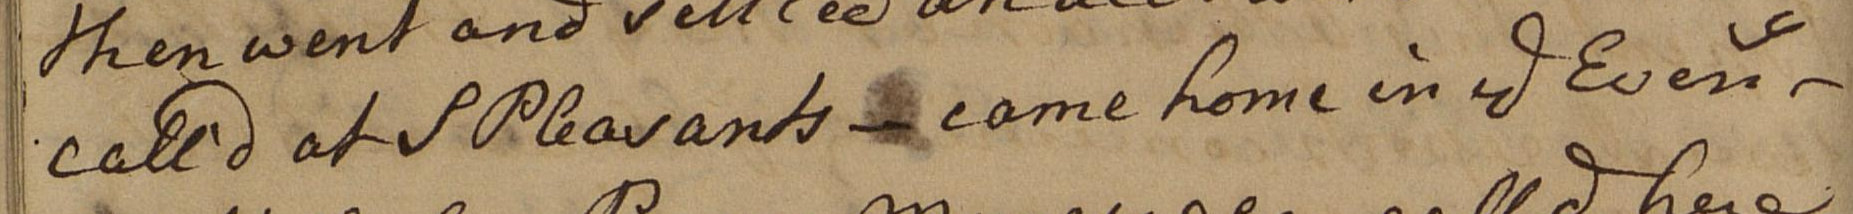call'd at S Pleasants- came home in y^e Even^g-
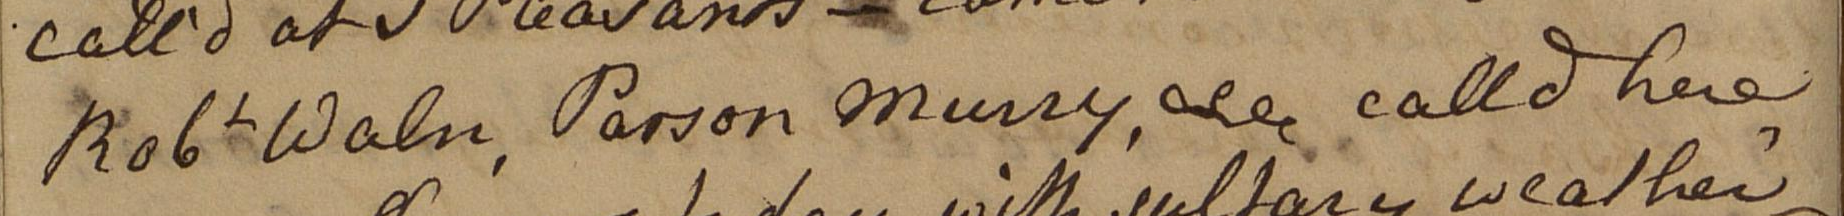Rob^t. Waln, Parson Murry, &c calld here
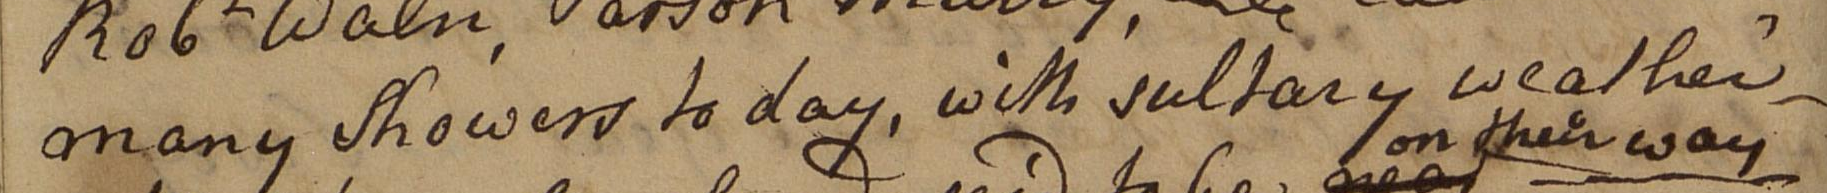many Showers to day, with sultary weather-
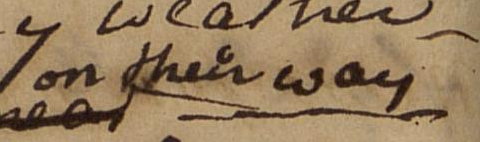on their way
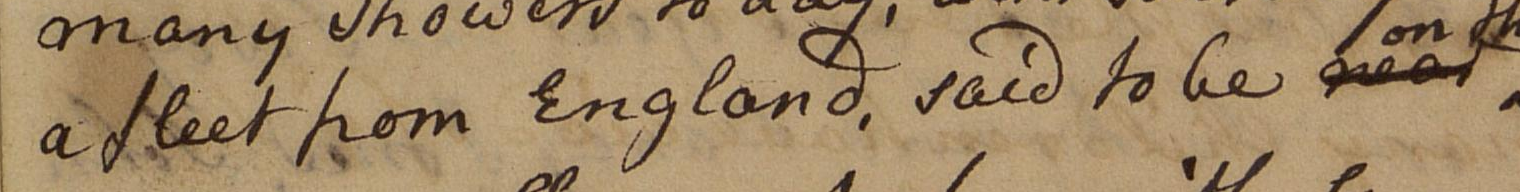a fleet from England, said to be near
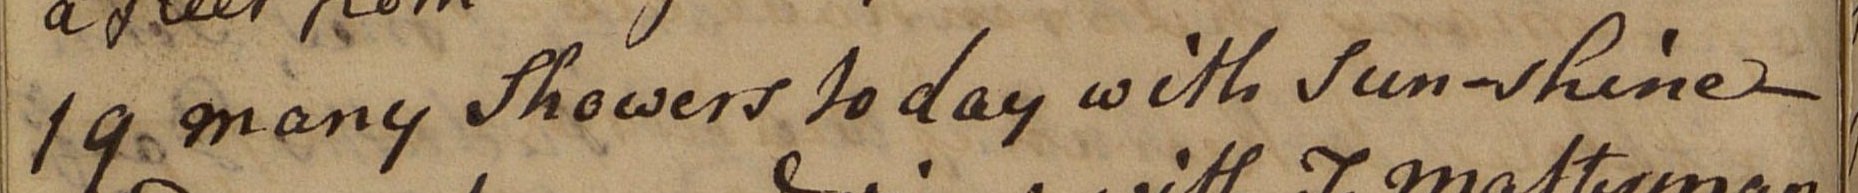19 many Showers to day with sun-shine-
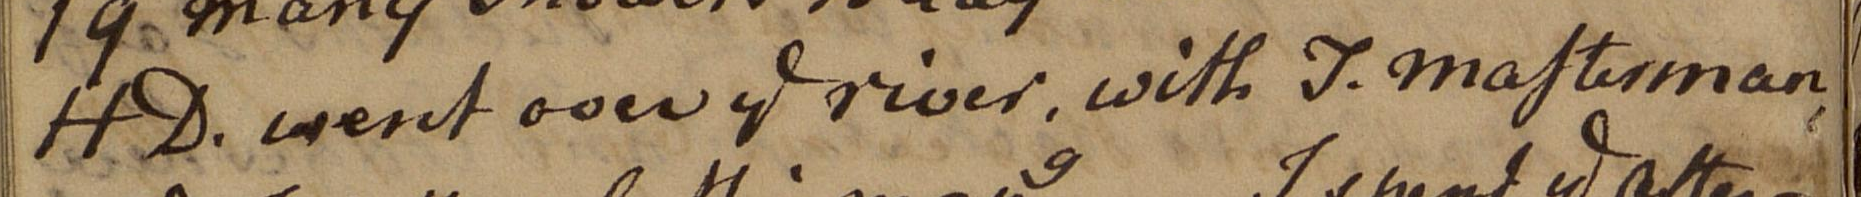HD. went over y^e river, with T. Masterman
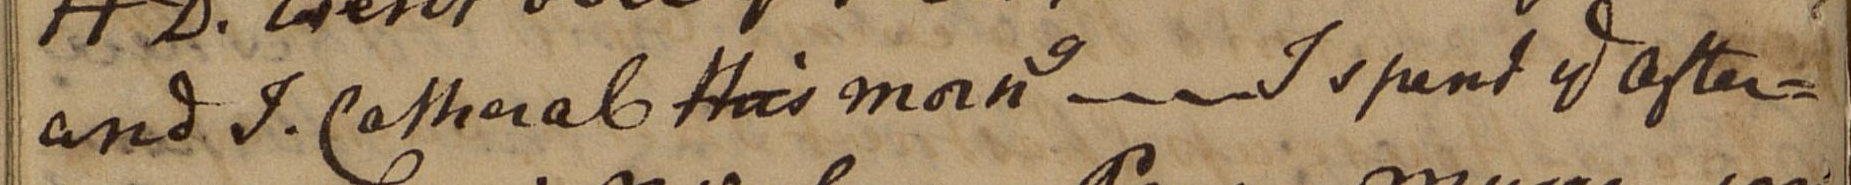and J. Catheral this morn^g- I spent y^e after-
